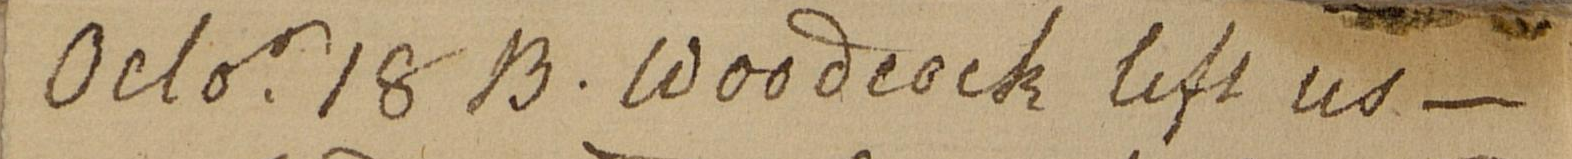Octo^r. 18 B. Woodcock left us-
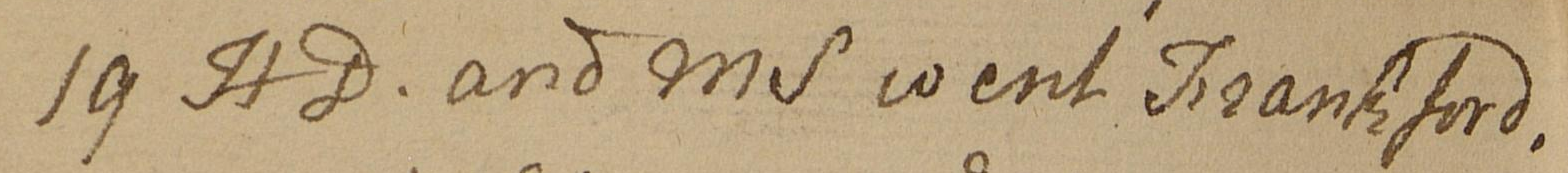19 HD and MS went Frankford.
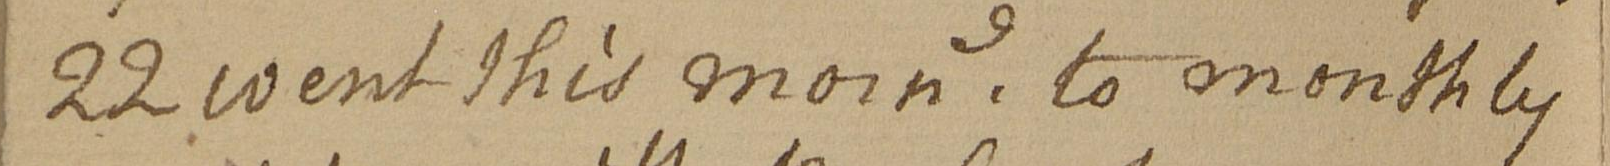22 went this morn^g. to monthly
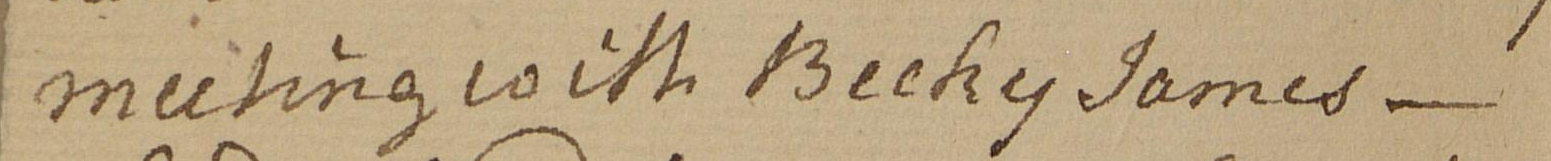meeting with Becky James-
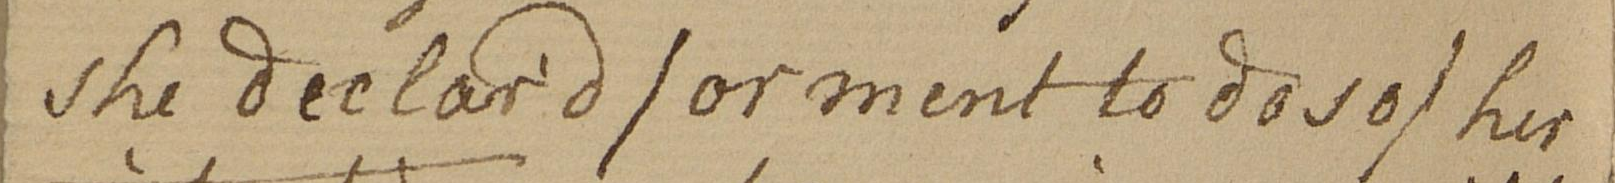she declar'd /or ment to do so/ her
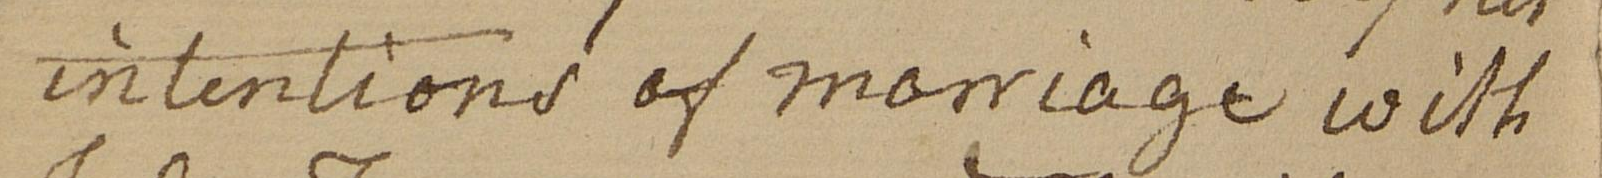intentions of marriage with
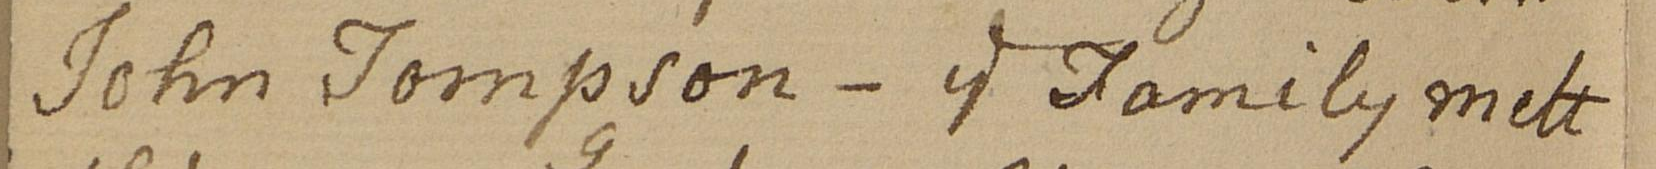John Tompson- y^e Family mett
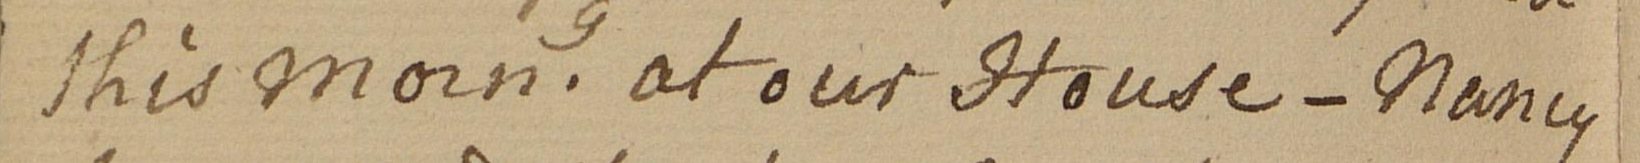this morn^g. at our House- Nancy
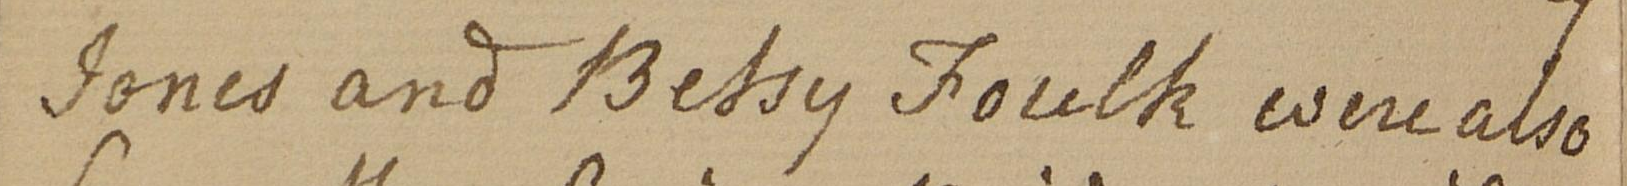Jones and Betsy Foulk were also
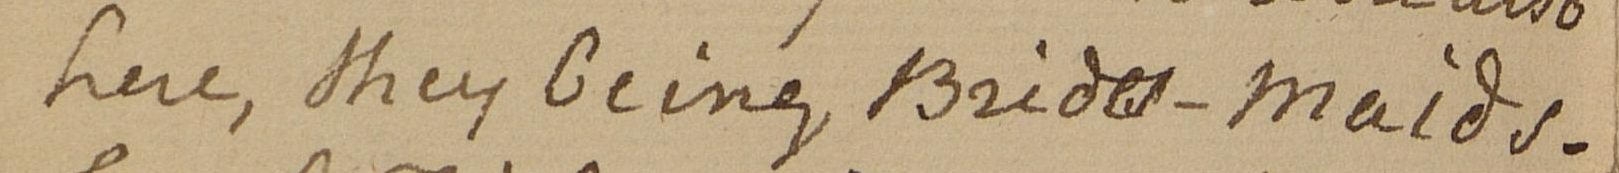here, they being Brides-Maids.
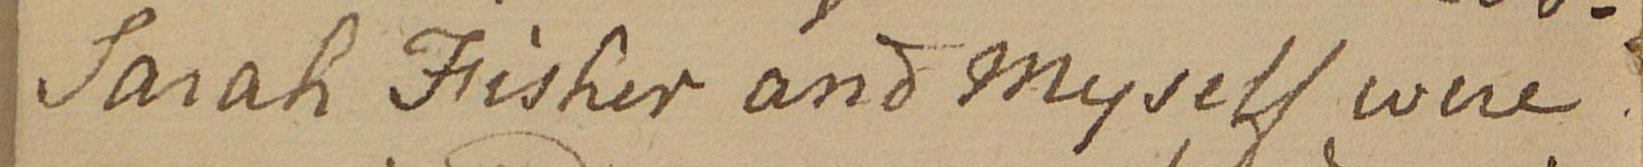Sarah Fisher and Myself were
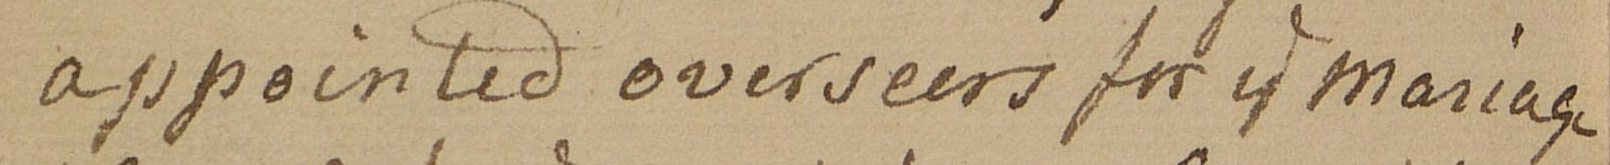appointed overseers for y^e Mariage
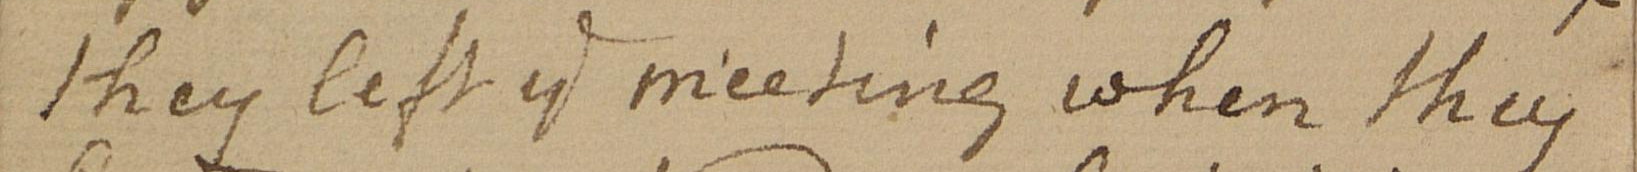they left y^e meeting, when they
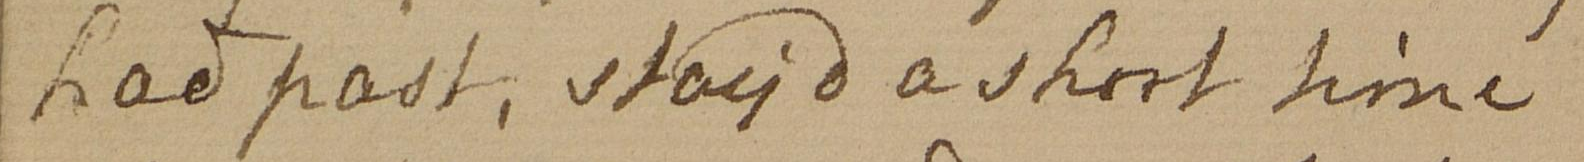had past, stay'd a short time
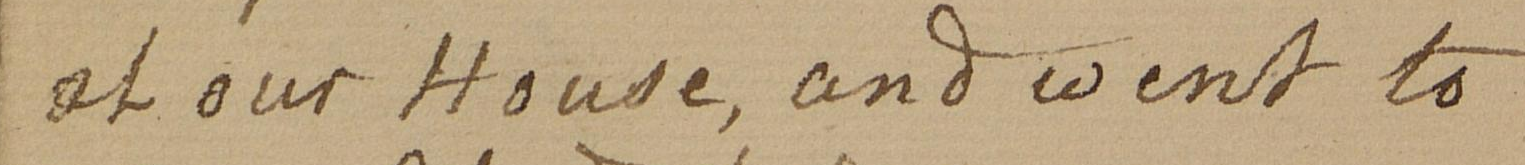at our House, and went to
